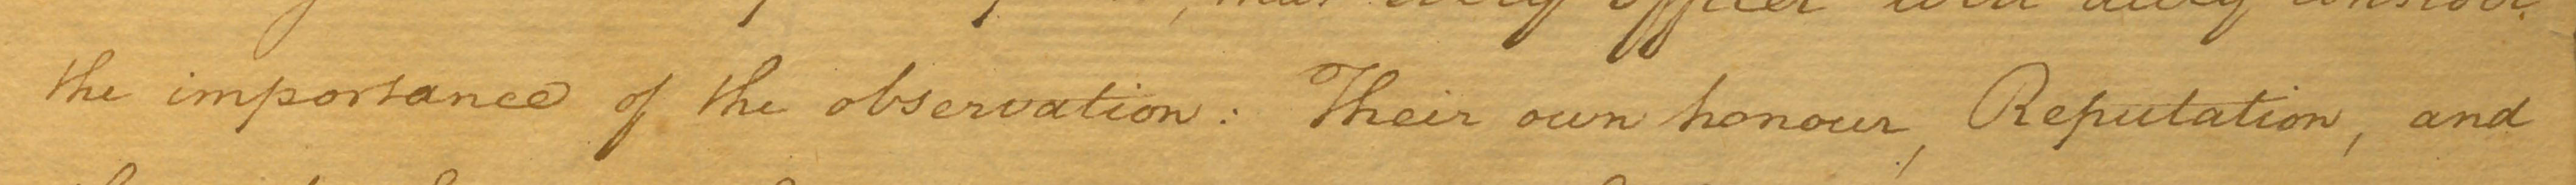the importance of the observation: Their own honour, Reputation, and
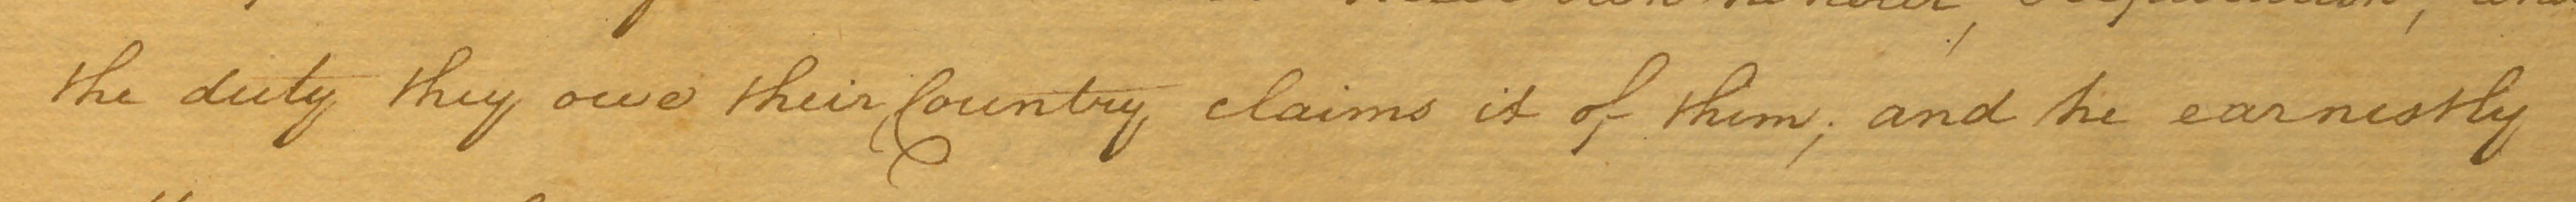the duty they owe their Country claims it of them; and he earnestly
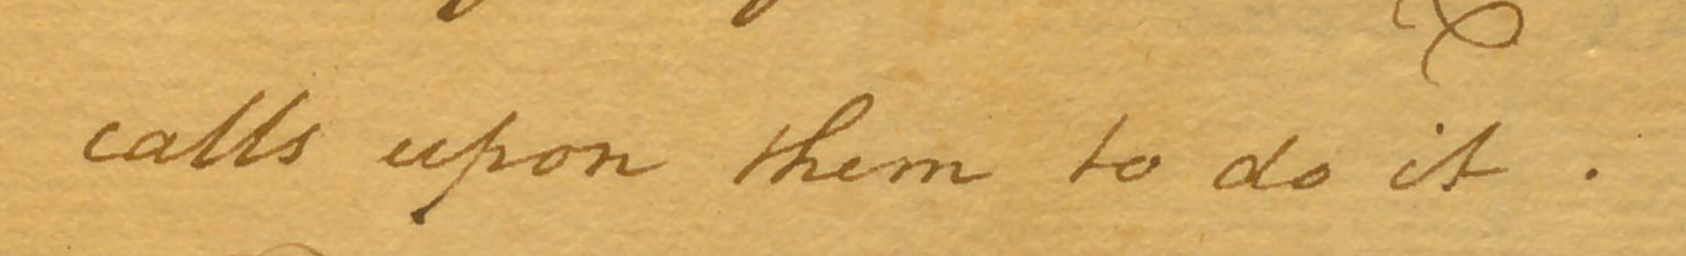calls upon them to do it.
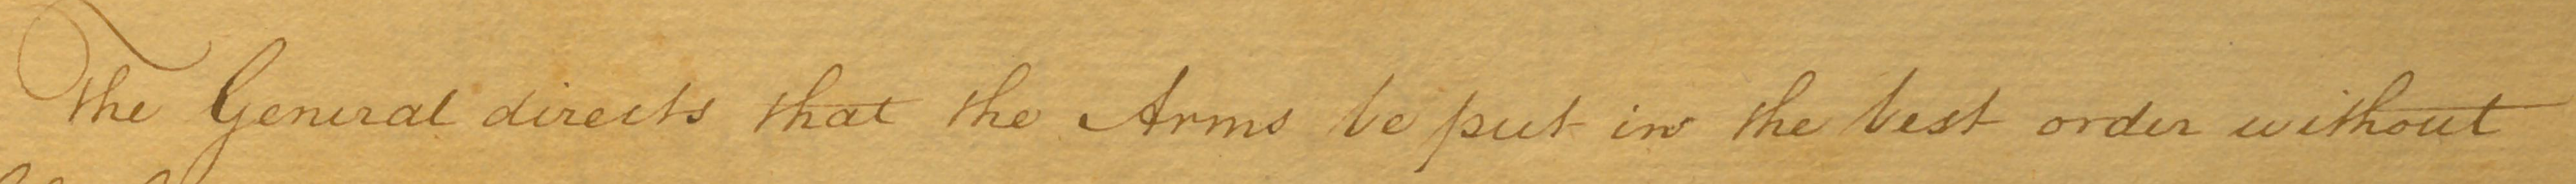The General directs that the Arms be put in the best order without
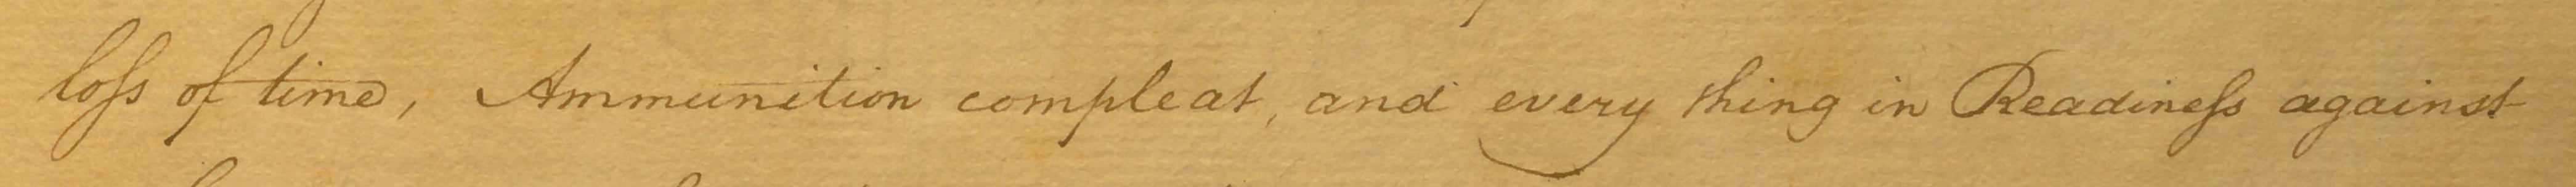loss of time, Ammunition compleat, and every thing in Readiness against
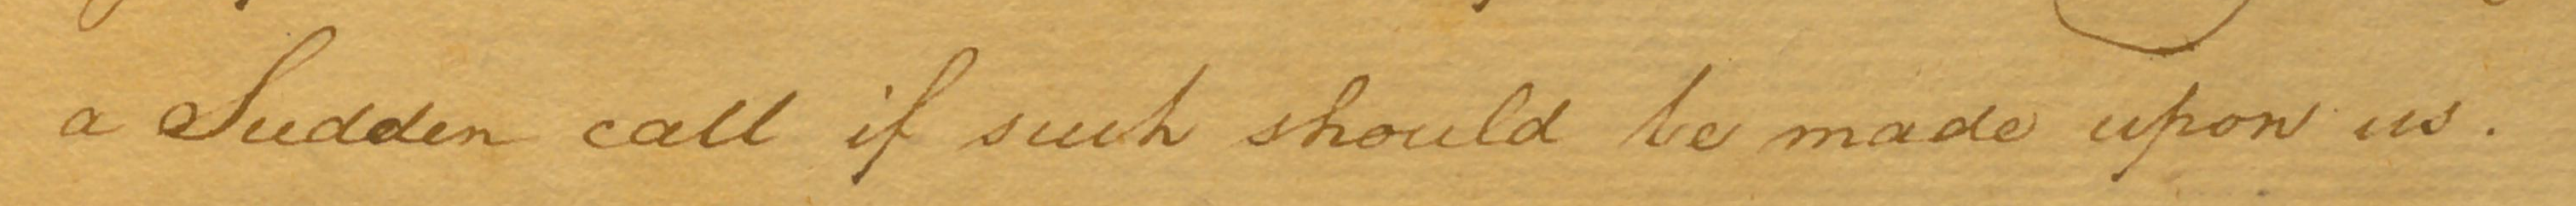a Sudden call if such should be made upon us.
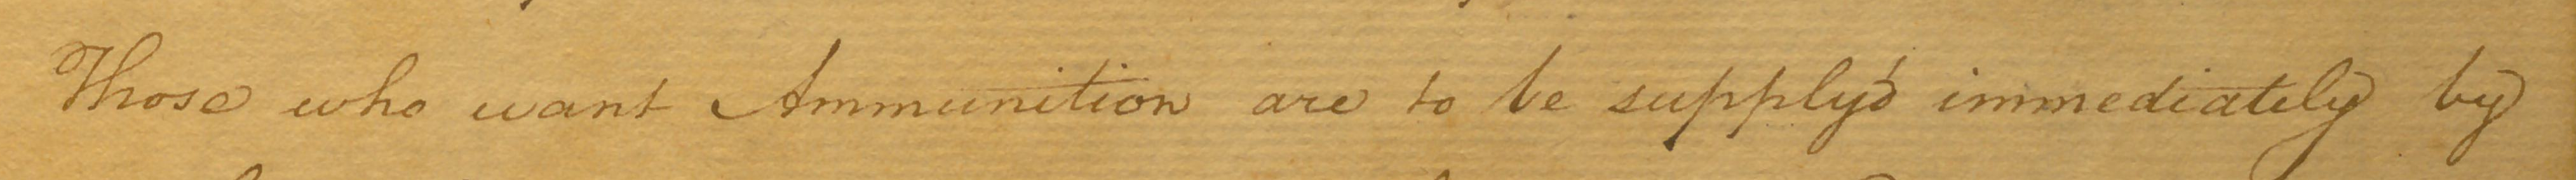Those who want Ammunition are to be supply'd immediately by
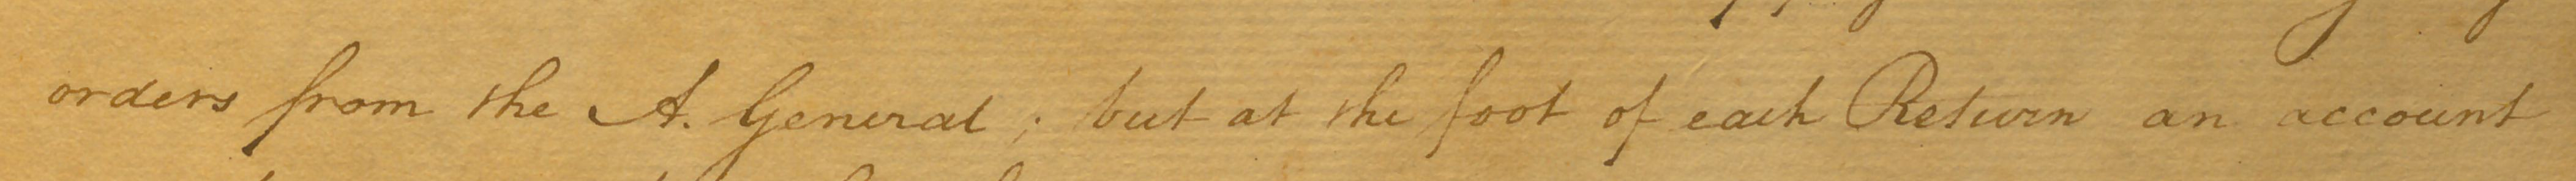orders from the A. General; but at the foot of each Return an account
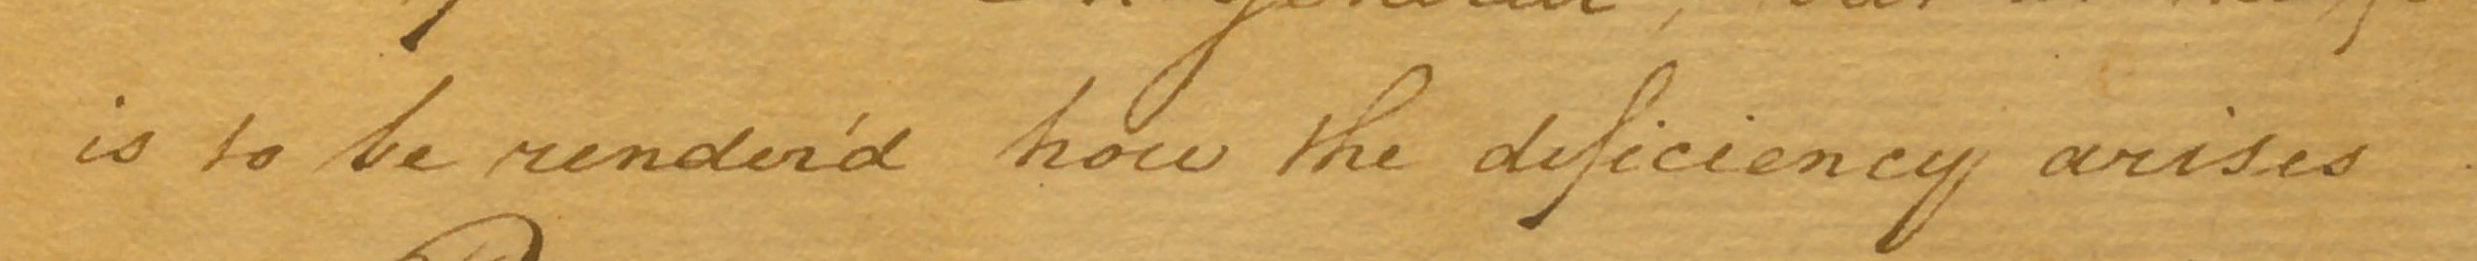is to be render'd how the deficiency arises
